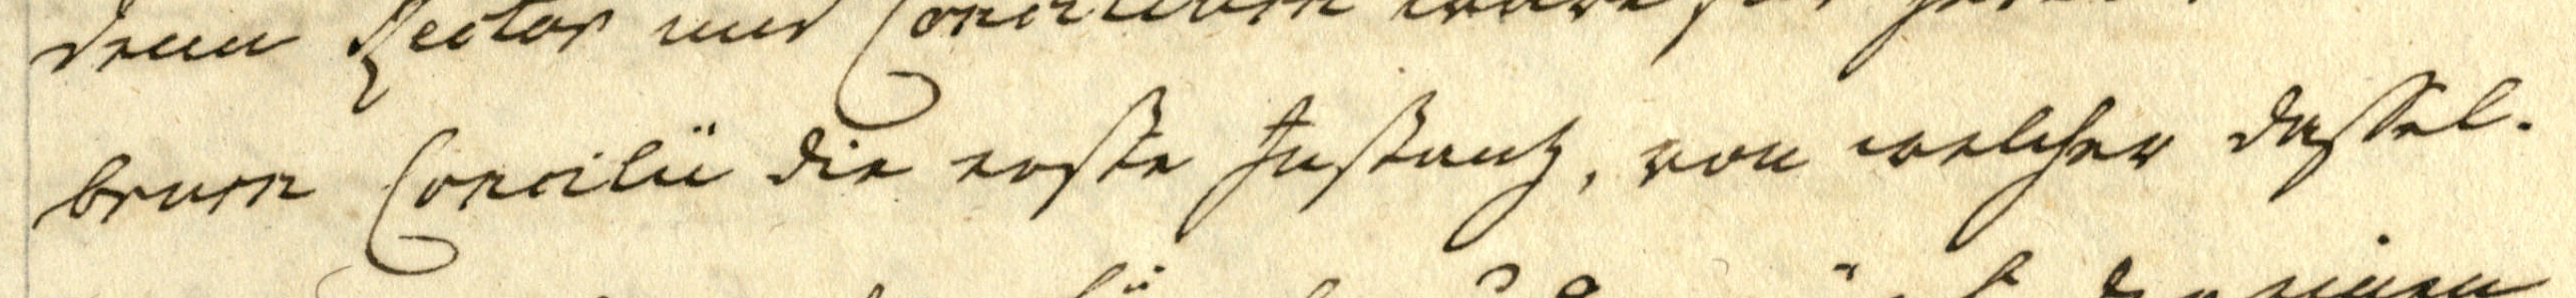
brum Concilii die erste Instanz, von welcher dassel¬
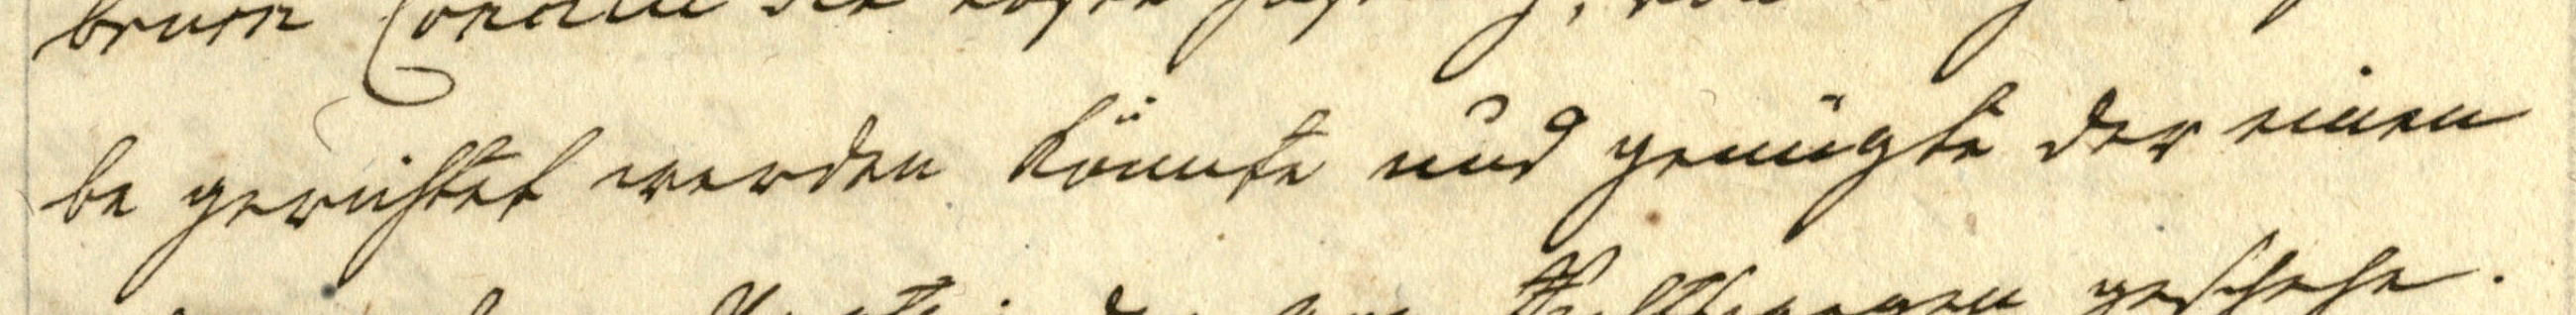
be gerichtet werden könnte und genügte der einen
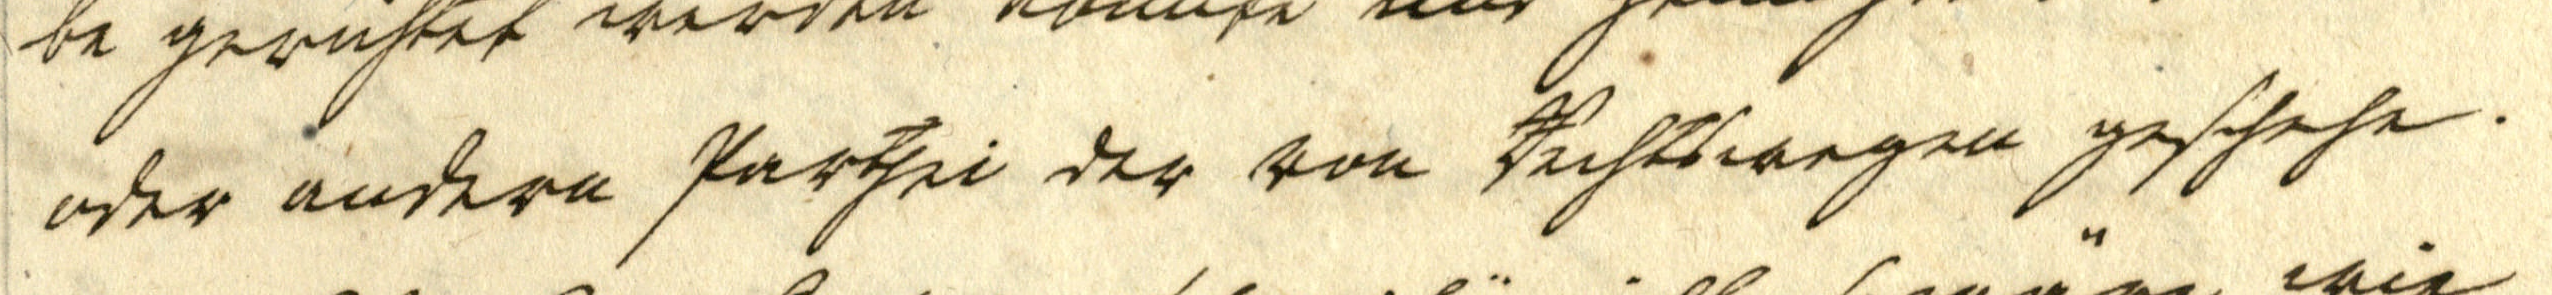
oder andern Parthei der von Rechtswegen geschehe¬
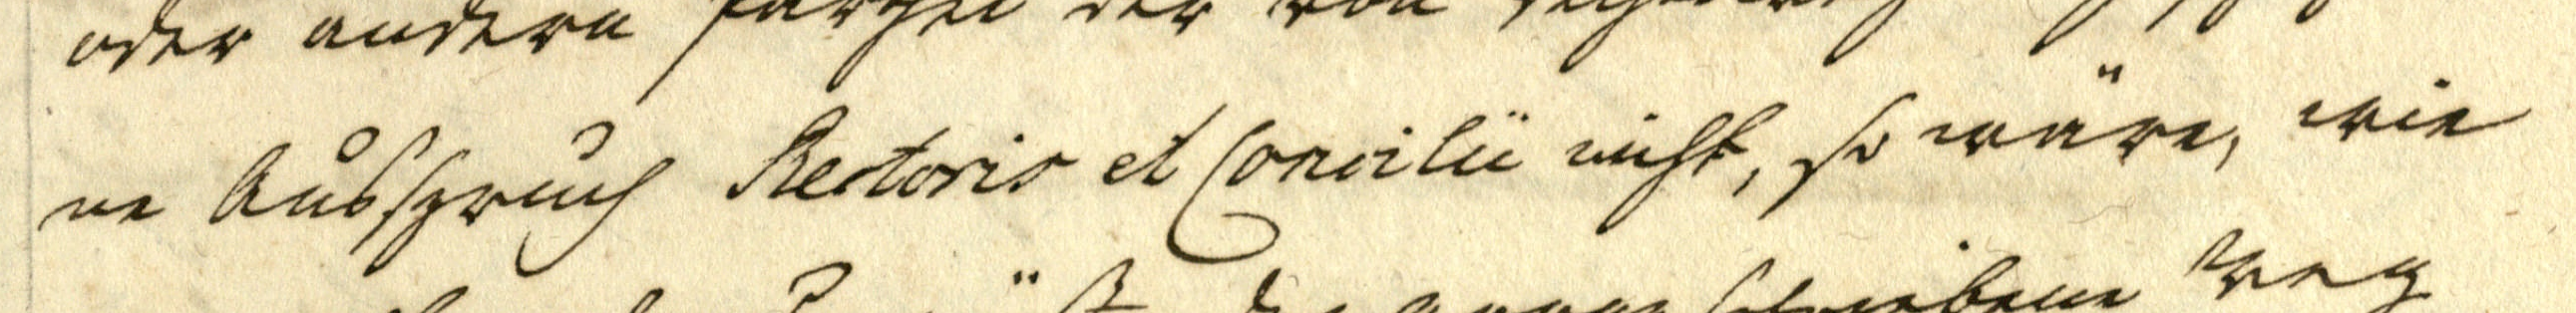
ne Ausspruch Rectoris et Concilii nicht, so wäre, wie
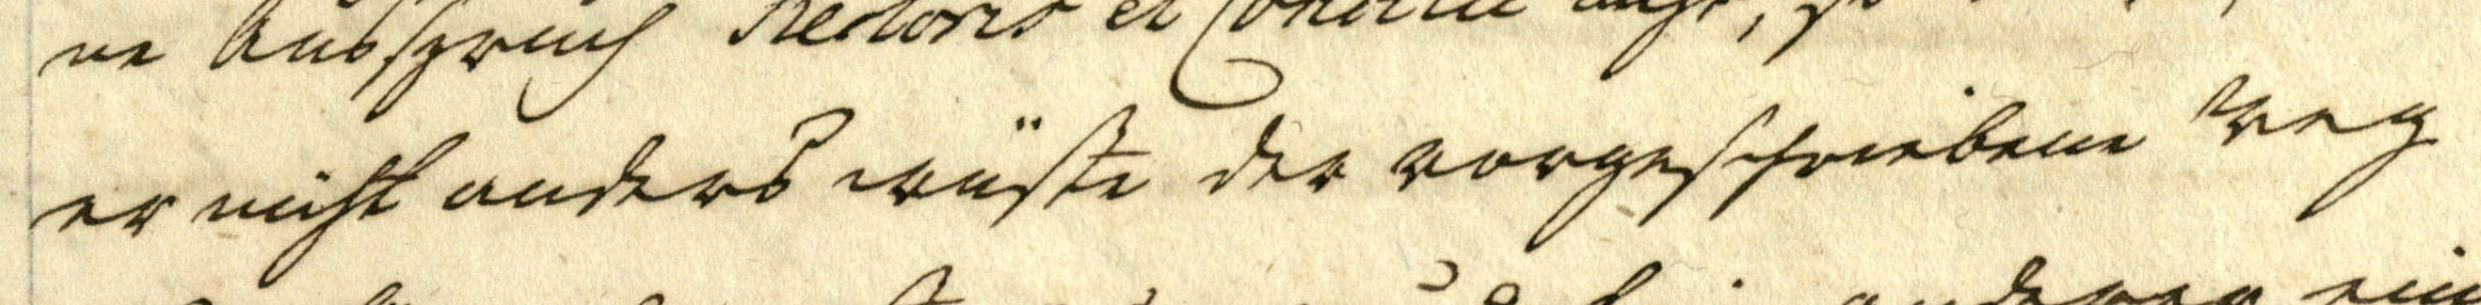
er nicht anders wüßte der vorgeschriebene Weg
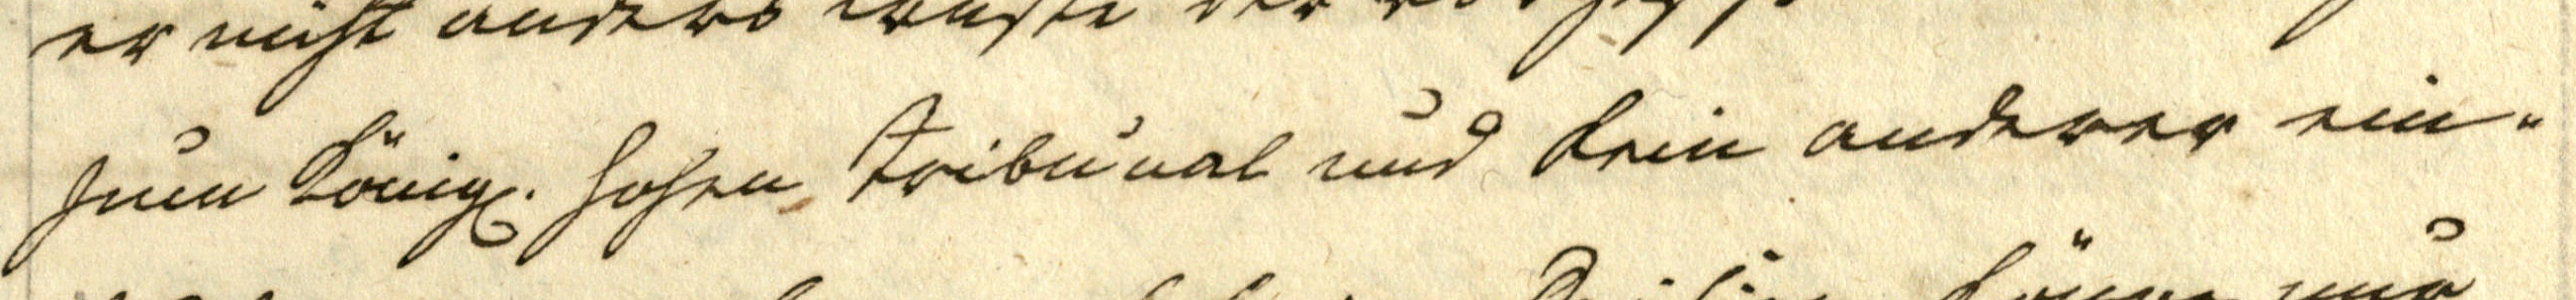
zum Königl. hohen Tribunal und kein anderer ein¬
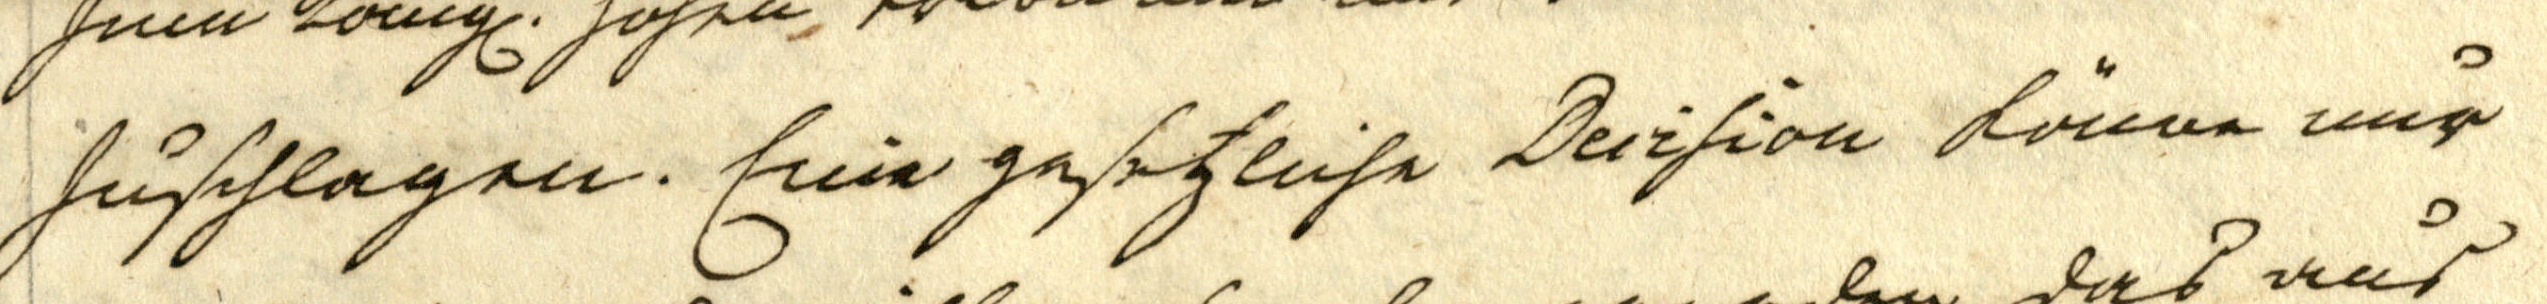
zuschlagen. Eine gesetzliche Decision könne nur
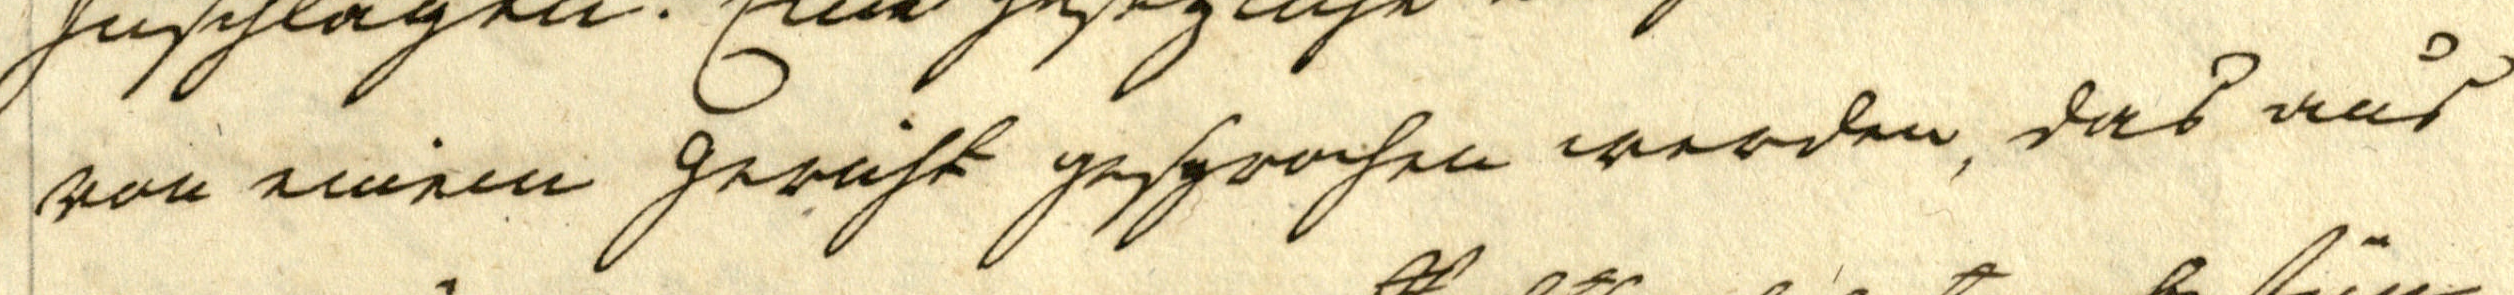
von einem Gericht gesprochen werden, das aus
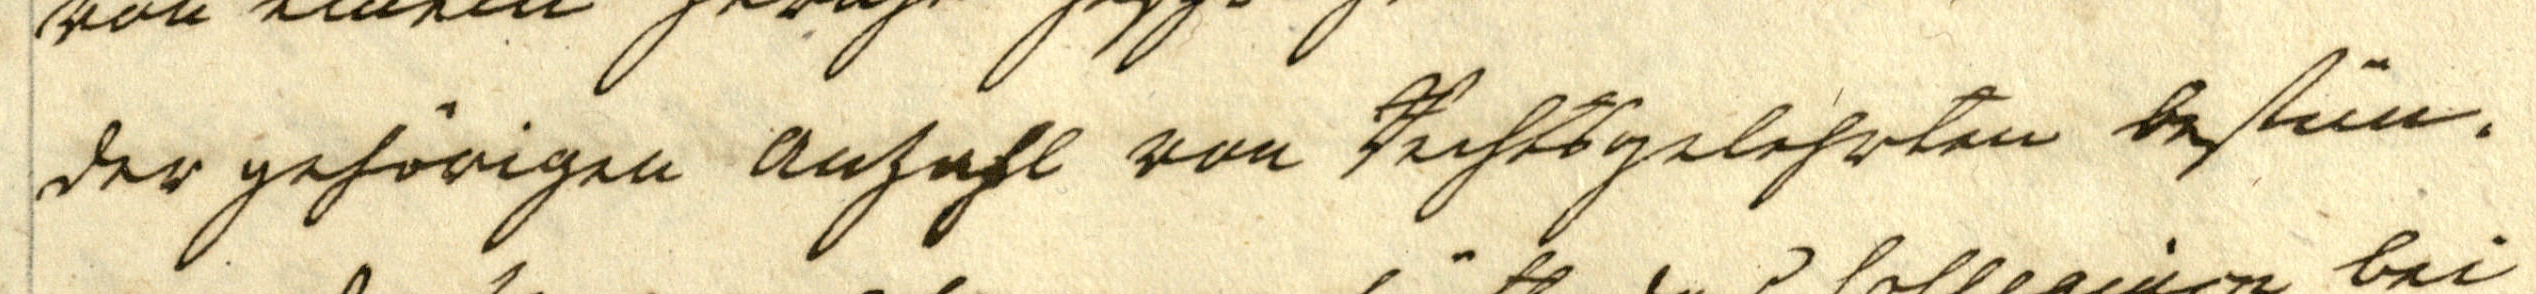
der gehörigen Anzahl von Rechtsgelehrten bestün¬
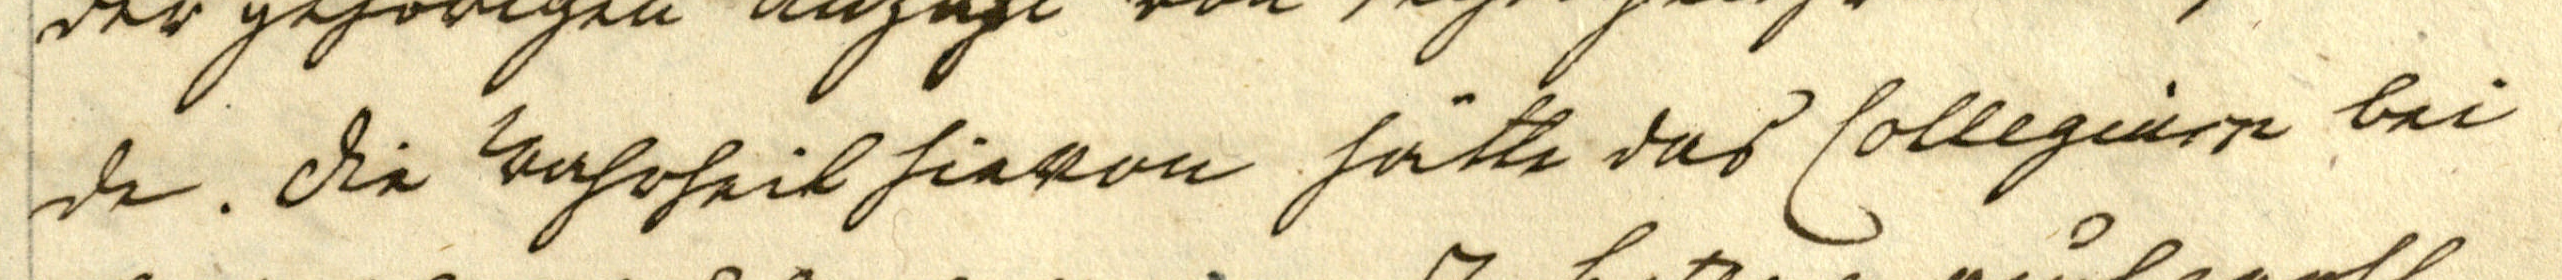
de. Die Wahrheit hievon hätte das Collegium bei
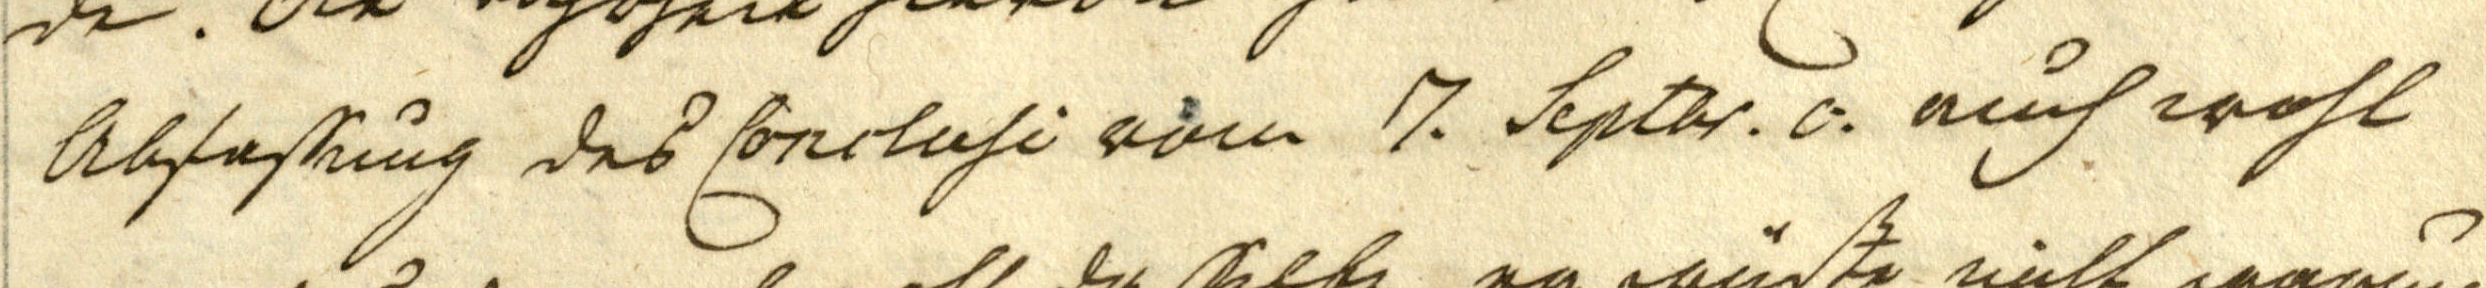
Abfassung des Conclusi vom 17. Septbr. c. auch wohl
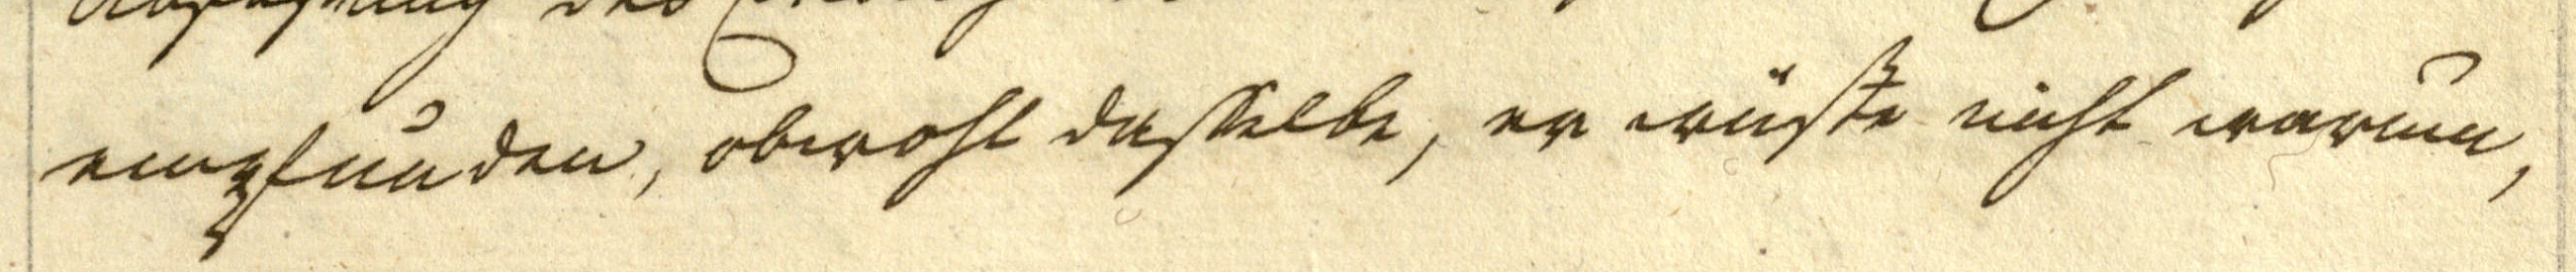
empfunden, obwohl dasselbe, er wüßte nicht warum,
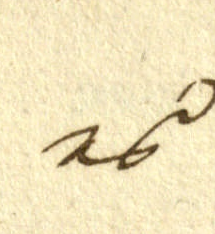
es
